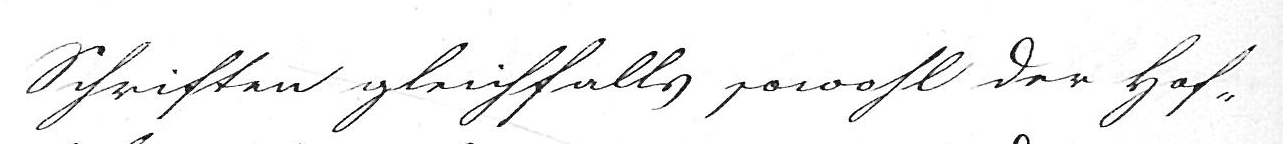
Schriften gleichfalls sowohl der Hof-
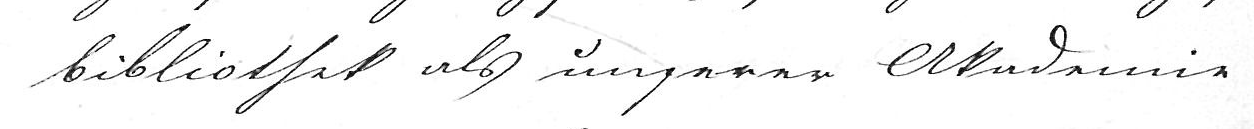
bibliothek als unserer Akademie
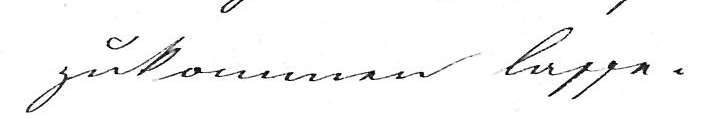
zukommen lasse.
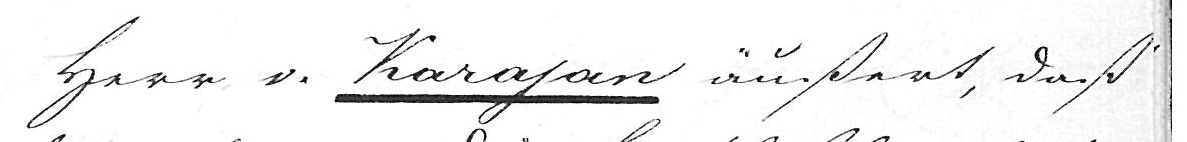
Herr v. Karajan äußert, daß
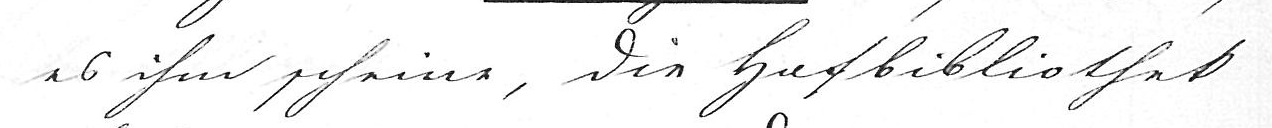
es ihm scheine, die Hofbibliothek
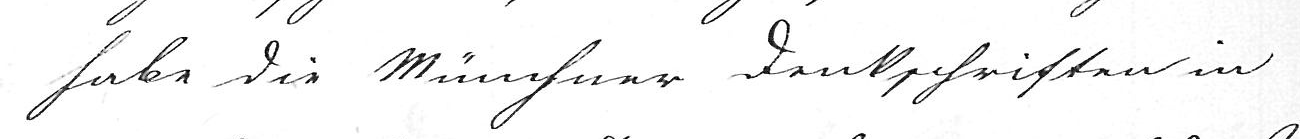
habe die Münchner Denkschriften in
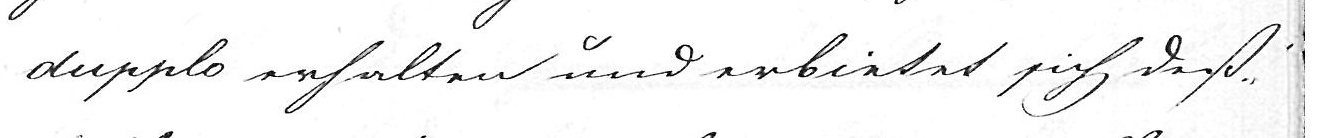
dupplo erhalten und erbietet sich, deß-
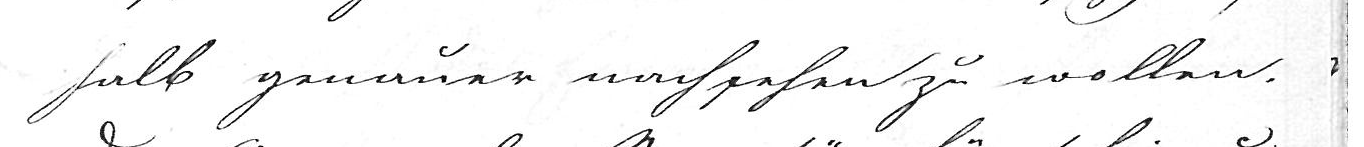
halb genauer nachsehen zu wollen.
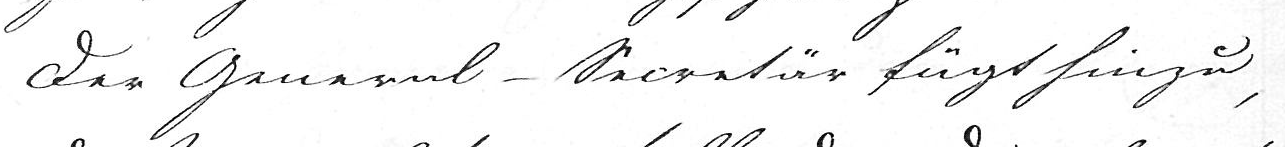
Der General-Secretär fügt hinzu,
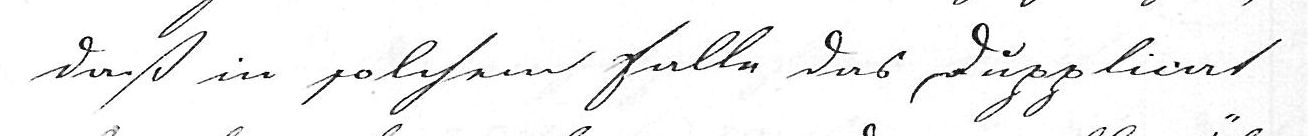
daß in solchem Falle das Dupplicat
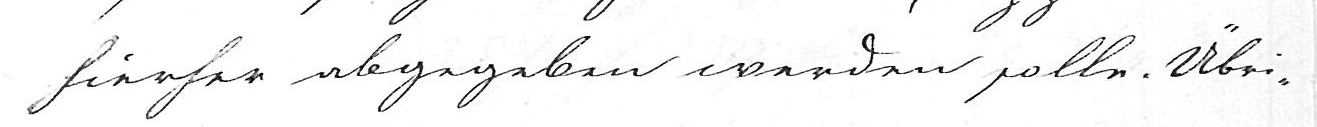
hierher abgegeben werden solle. Übri-
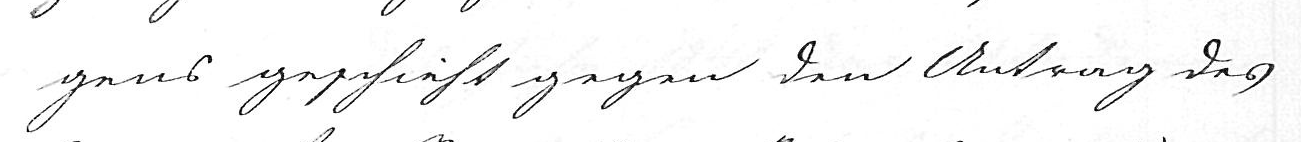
gens geschieht gegen den Antrag des
